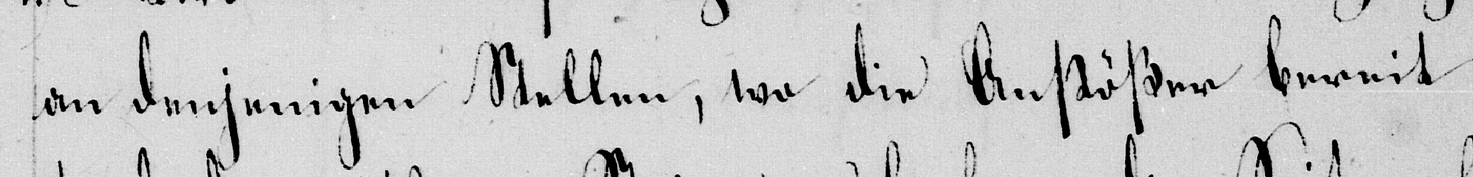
an denjenigen Stellen, wo die Anstößer bereit
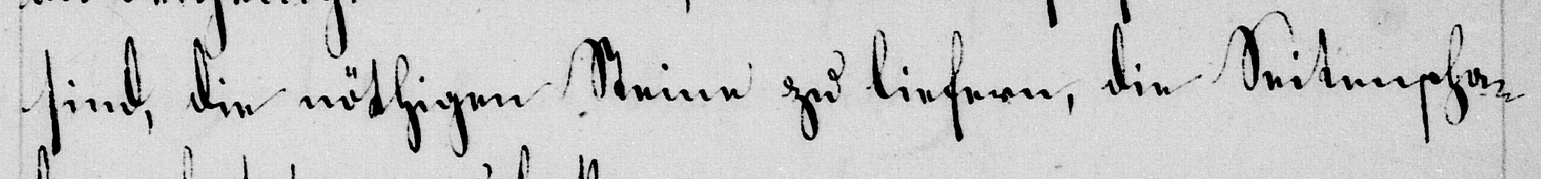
sind, die nöthigen Steine zu liefern, die Seitenscha¬
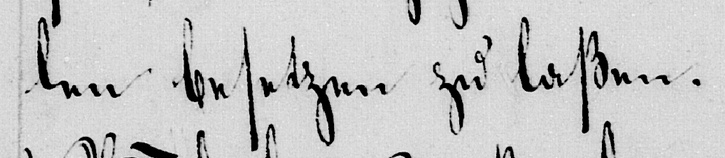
len besetzen zu laßen.
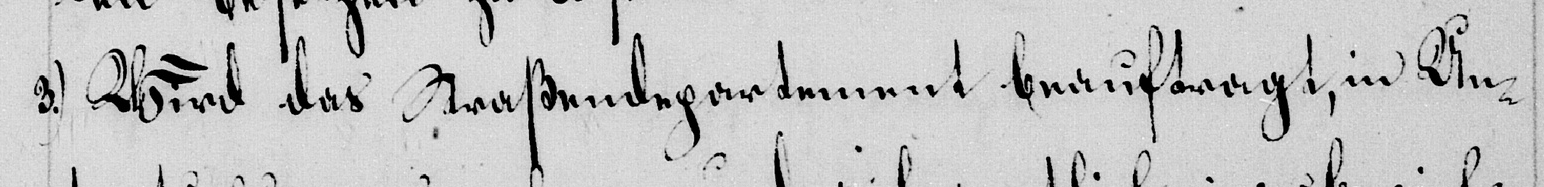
3.) Wird das Straßendepartement beauftragt, in Un¬
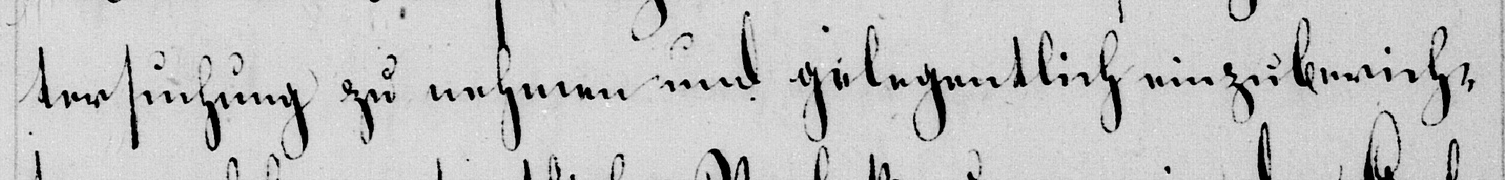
tersuchung zu nehmen und gelegentlich einzuberich¬
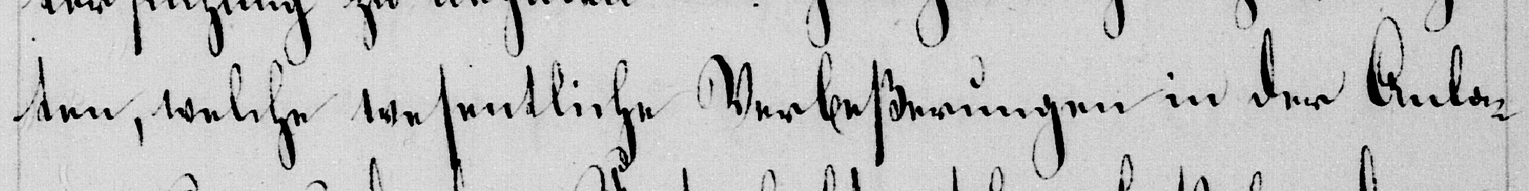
ten, welche wesentliche Verbeßerungen in der Anla¬
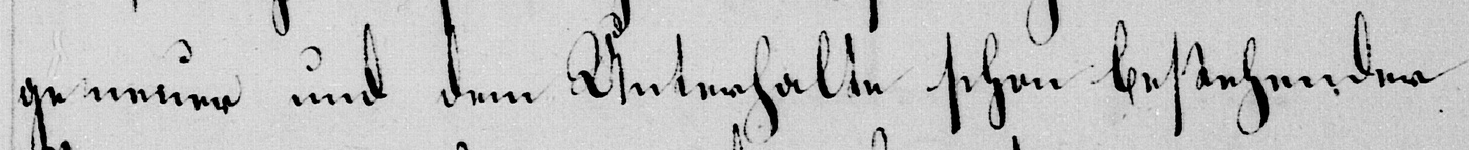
ge neuer und dem Unterhalte schon bestehender
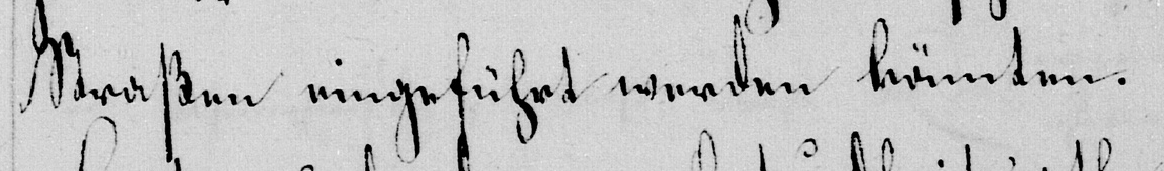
Straßen eingeführt werden könnten.
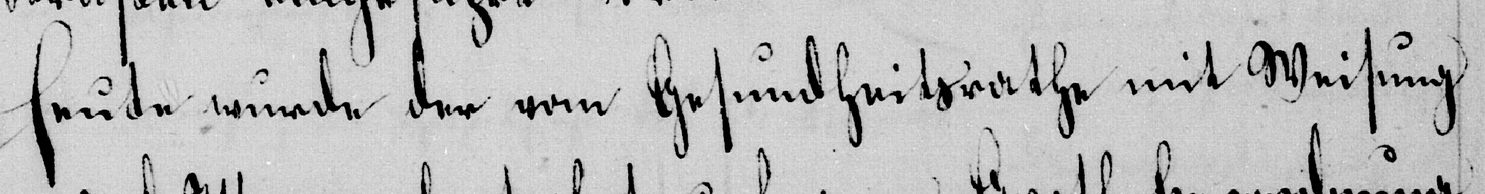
Heute wurde der vom Gesundheitsrathe mit Weisung
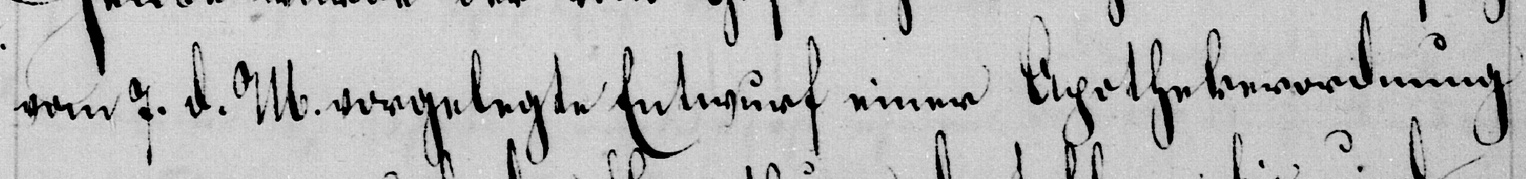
vom 7. d. M. vorgelegte Entwurf einer Apothekerordnung
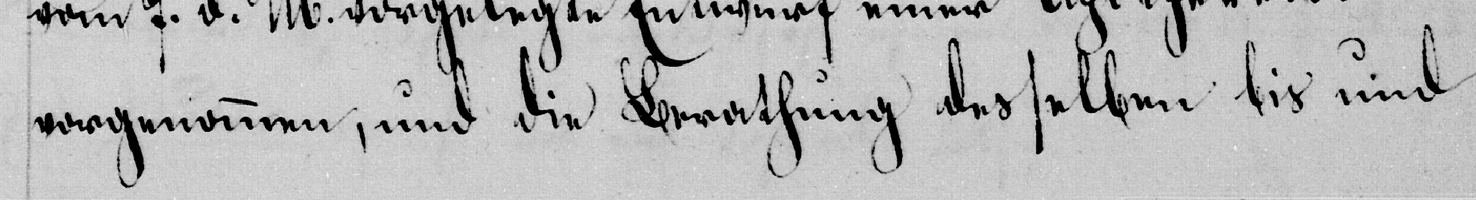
vorgenommen, und die Berathung desselben bis und
